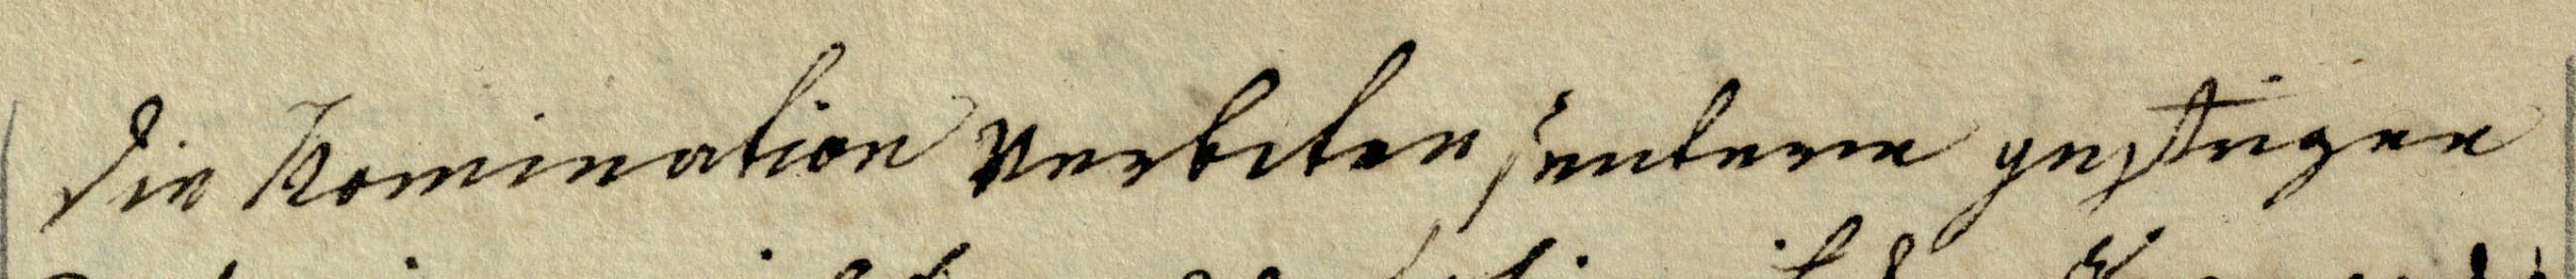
die Nomination verbeten, unterm gestrigen
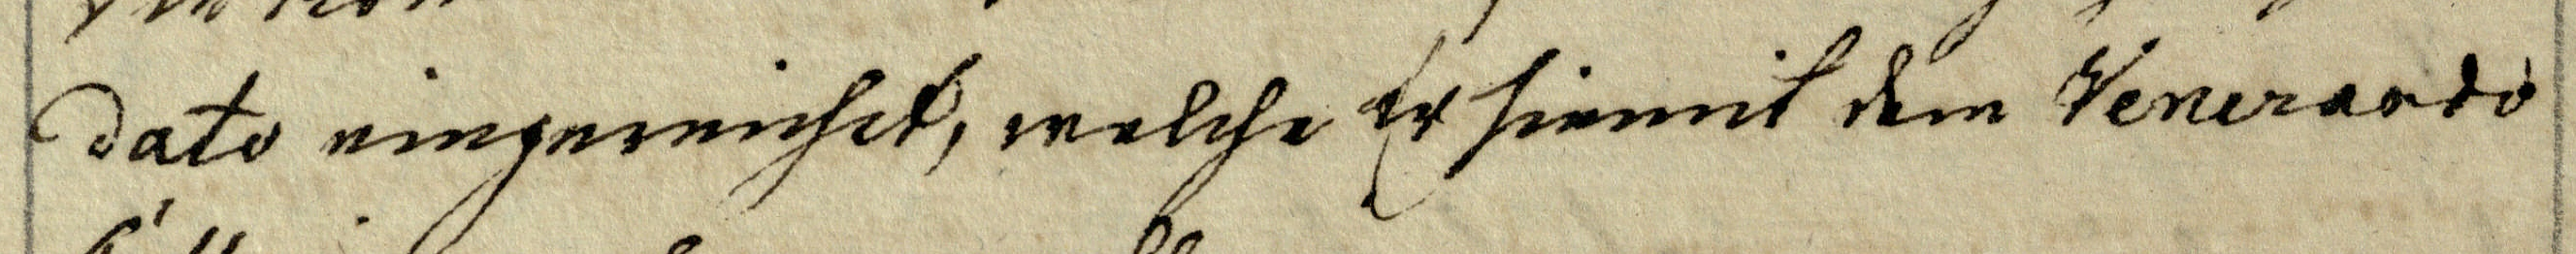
dato eingereichet, welche Er hiemit den Venerando
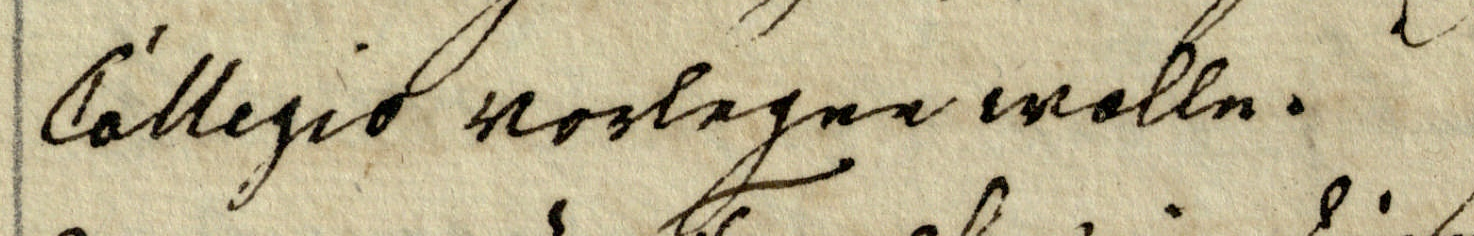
Collegio vorlegen wolle.
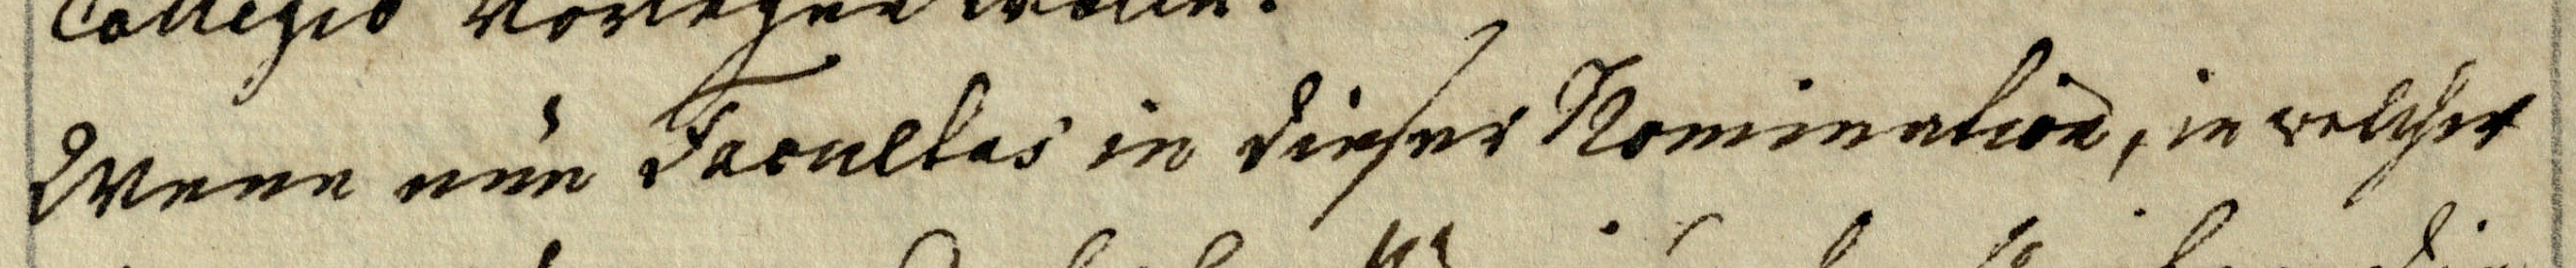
Wenn nun Facultas in dieser Nomination, in welcher
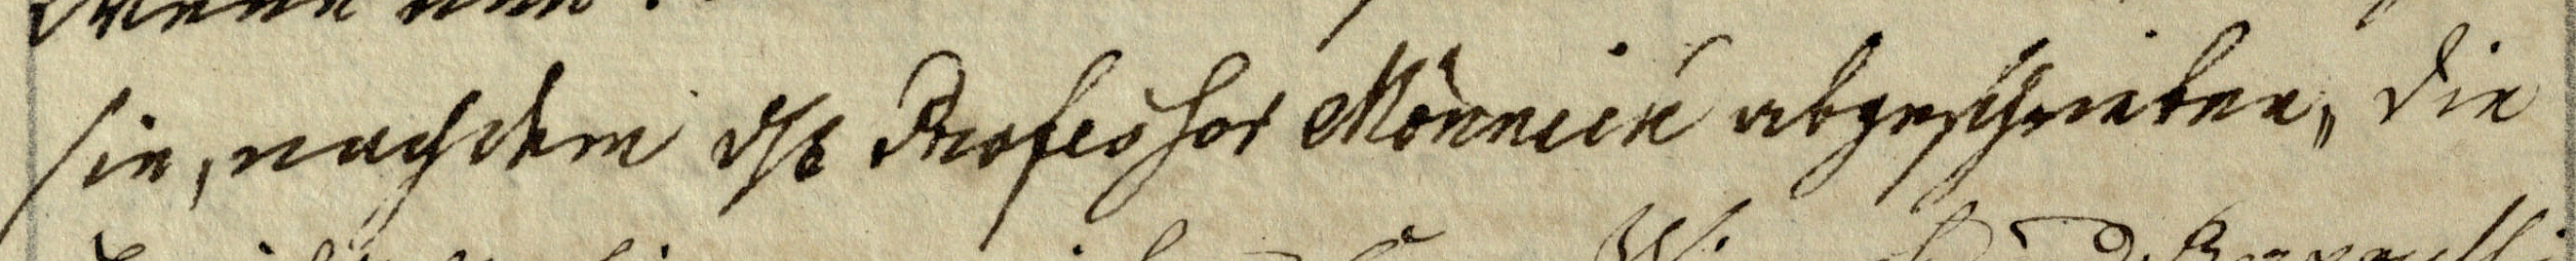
sie, nachdem dh Professor Mönnich abgeschrieben, die
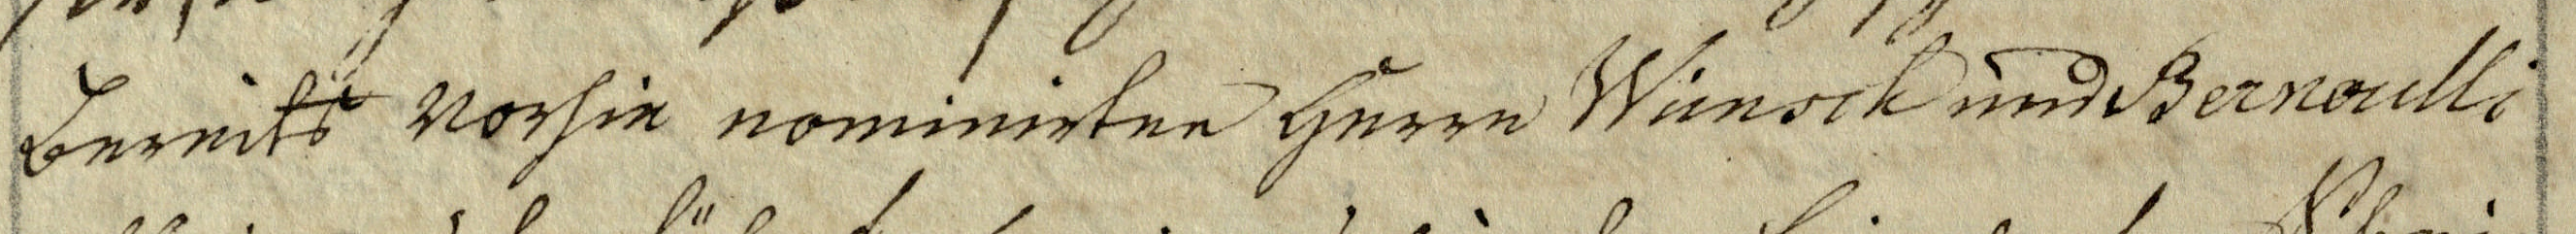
bereits vorhin nominirten Herrn Wunsch und Bernoulli¬
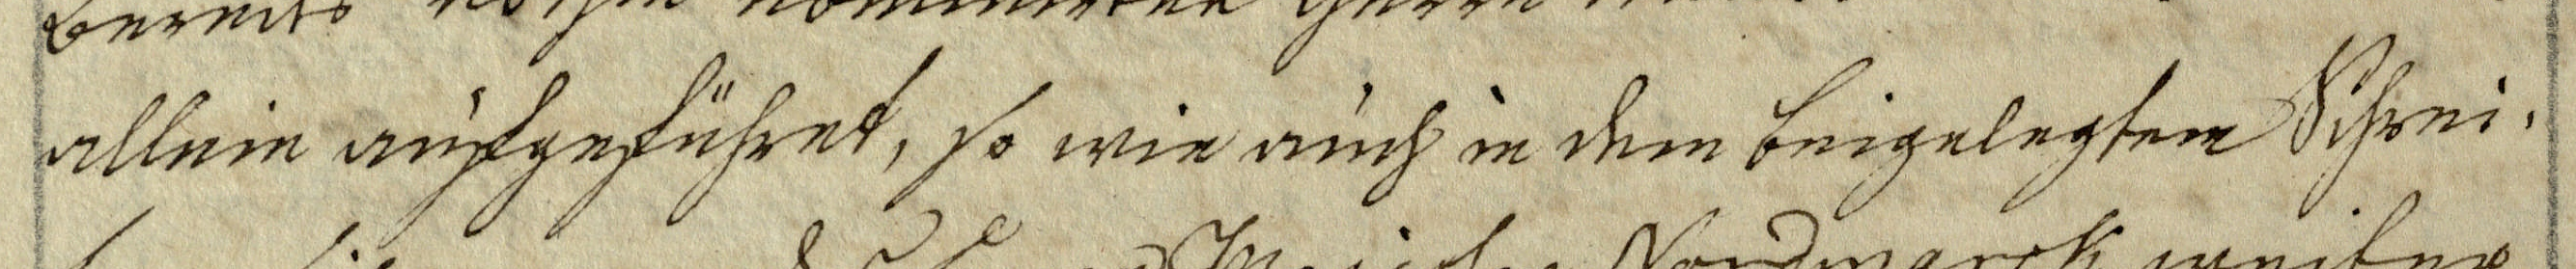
allein aufgeführet, so wie auch in dem beigelegten Schrei¬
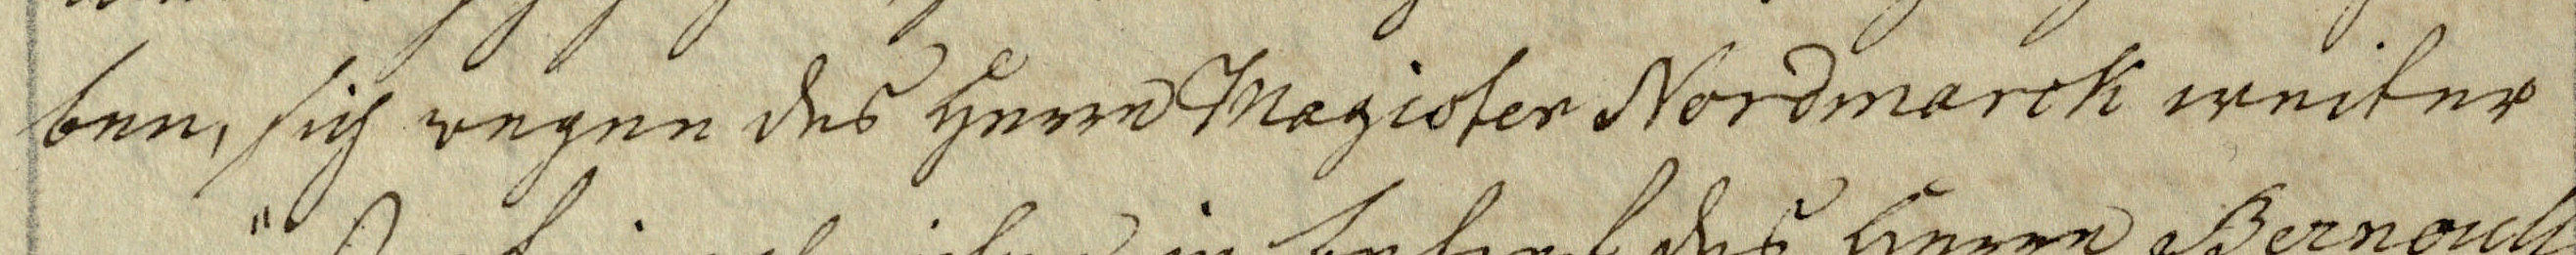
ben, sich wegen des Herrn Magister Nordmarck weiter
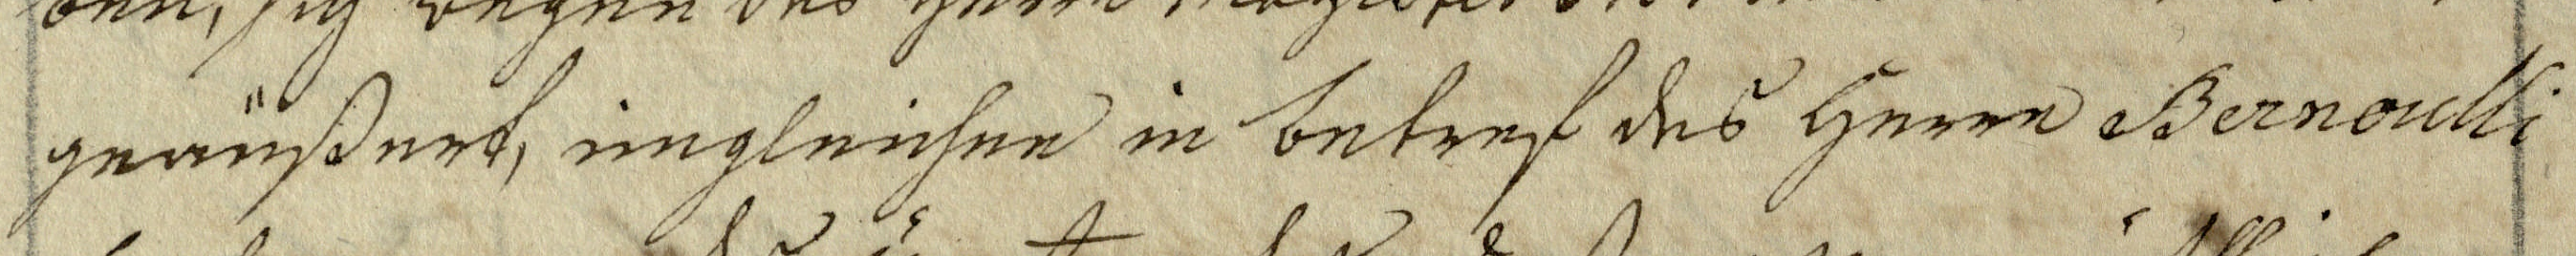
geäußert, imgleichen in Betref des Herrn Bernoulli
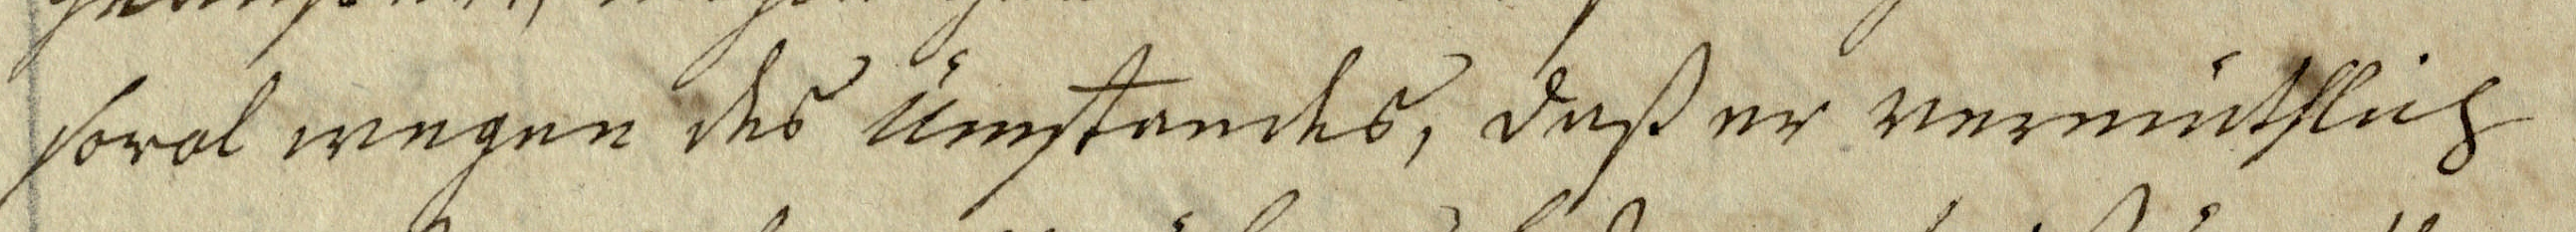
sowol wegen des Umstandes, daß er vermuthlich
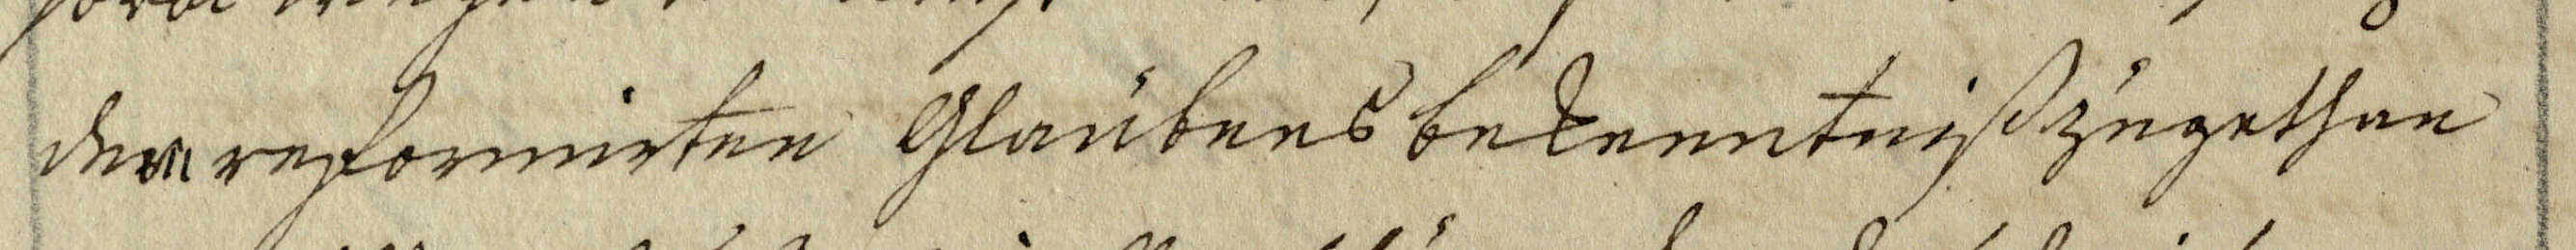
dem reformirten Glaubensbekenntniß zugethan
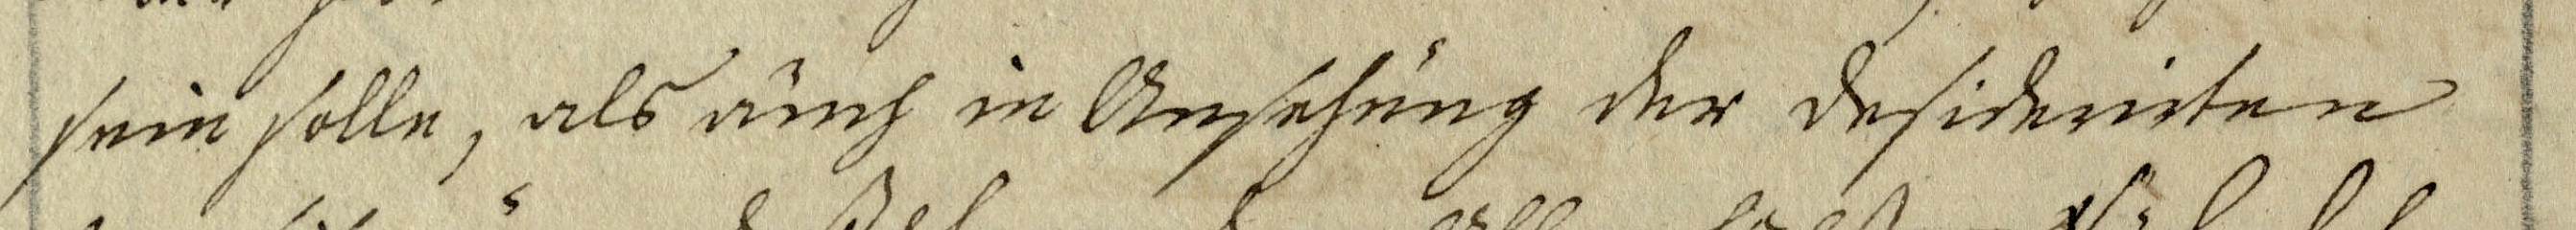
sein solle, als auch in Ansehung der desideriten
